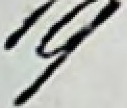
19
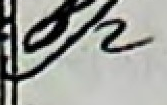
8 ½
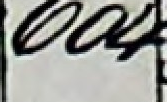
604
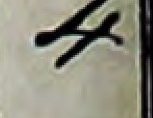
4
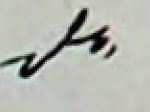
do
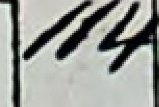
114
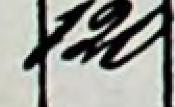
120
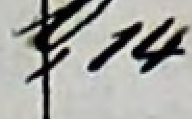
0,14
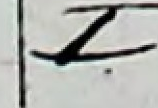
I
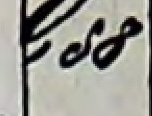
0,88
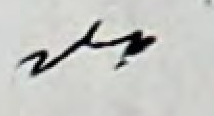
do
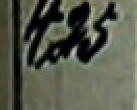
4,35
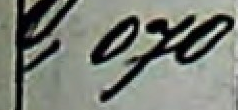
0,070
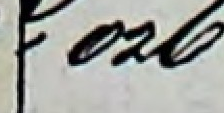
0,026
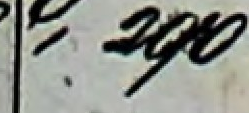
0,290
